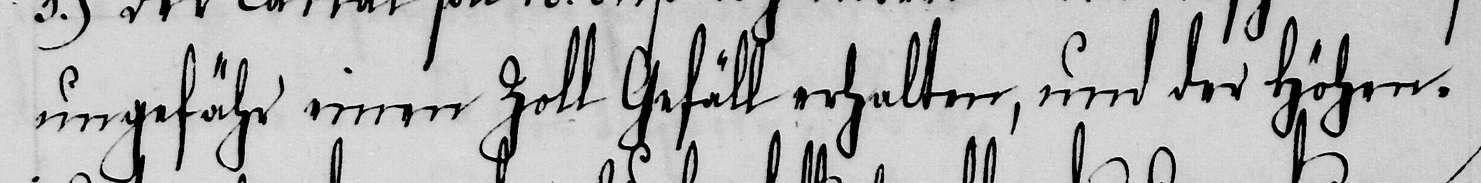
ungefähr einen Zoll Gefäll erhalten, und der Höhen¬
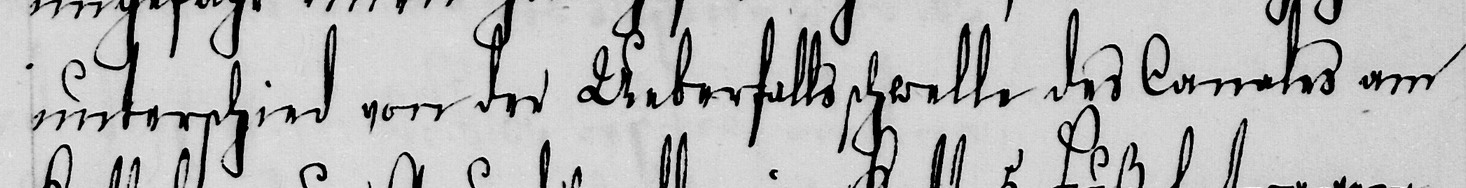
unterschied von der Ueberfallsschwelle des Canales am
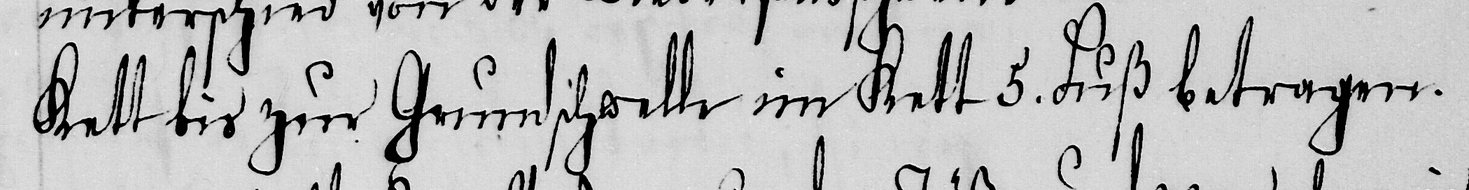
Kett bis zur Grundschwelle im Kett 5. Fuß betragen.
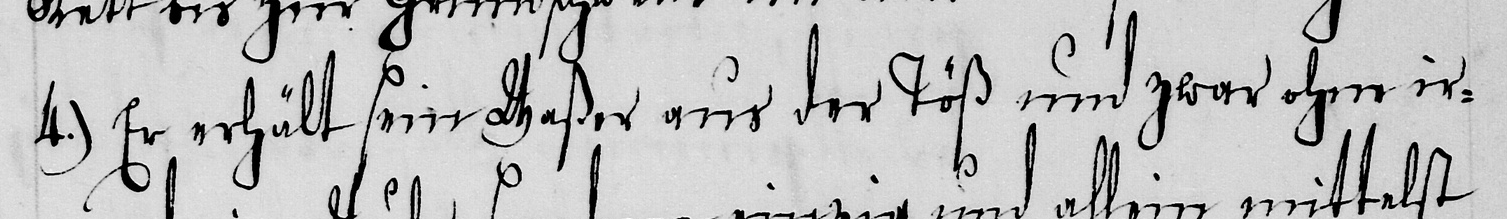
4.) Er erhält sein Waßer aus der Töß und zwar ohne ir¬
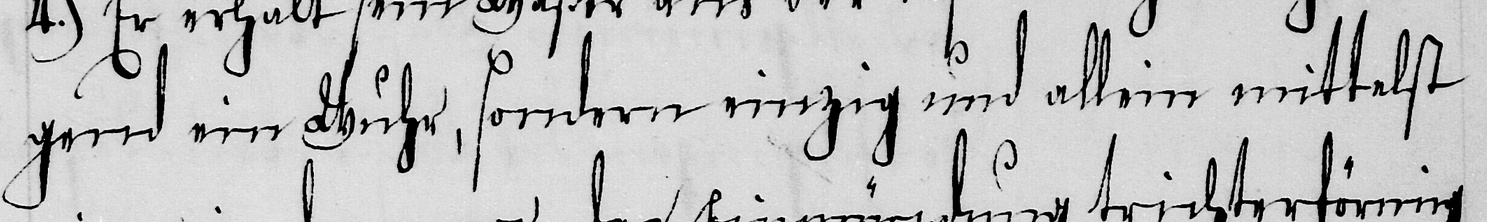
gend ein Wuhr, sondern einzig und allein mittelst
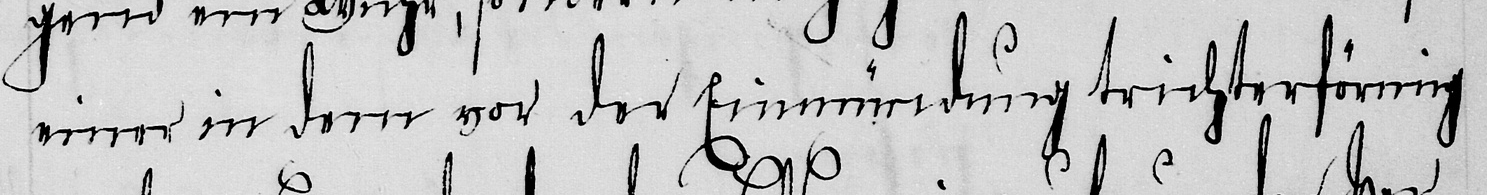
einer in dem vor der Einmündung trichterförmig
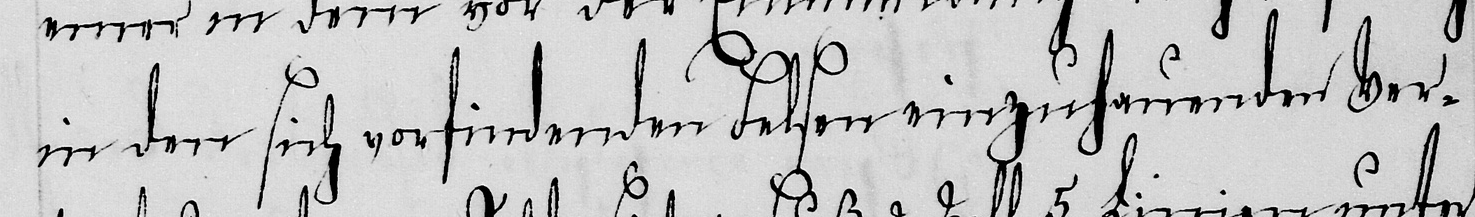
in den sich vorfindenden Felsen einzuhauenden Ver¬
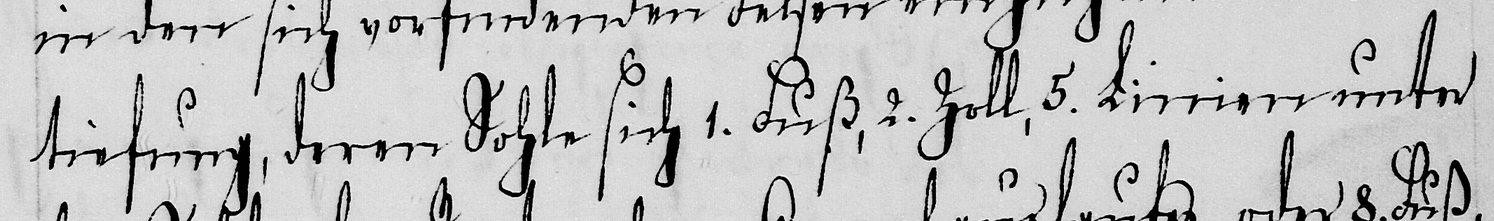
tiefung, deren Sohle sich 1. Fuß, 2. Zoll, 5. Linien unter
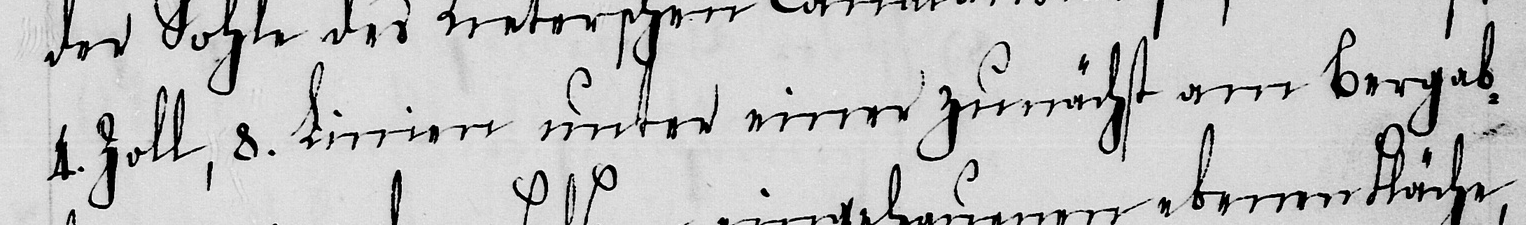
4. Zoll, 8. Linien unter einer zunächst am Bergab¬
